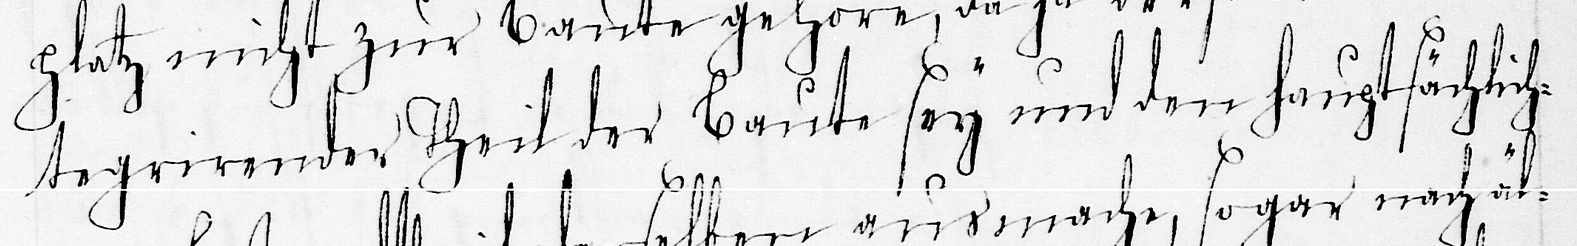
tegrirender Theil der Baute sey und den hauptsächlic¬
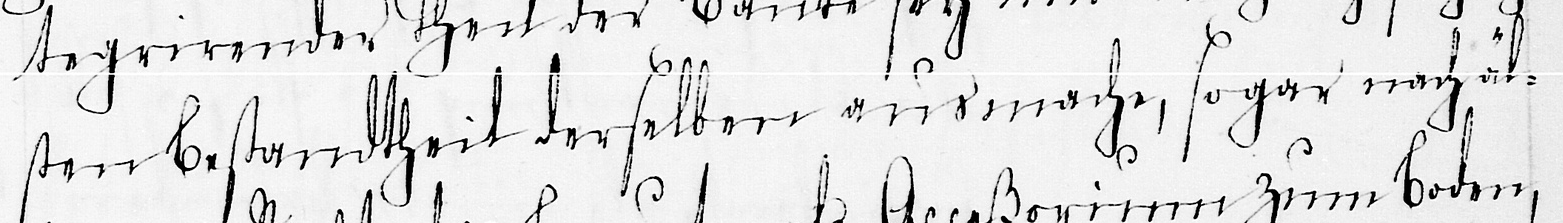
sten Bestandtheil derselben ausmache, sogar nach äl¬
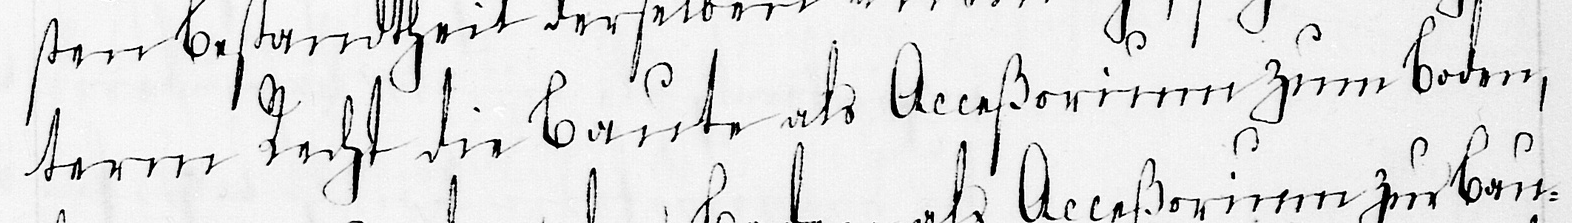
term Recht die Baute als Acceßorium zum Boden,
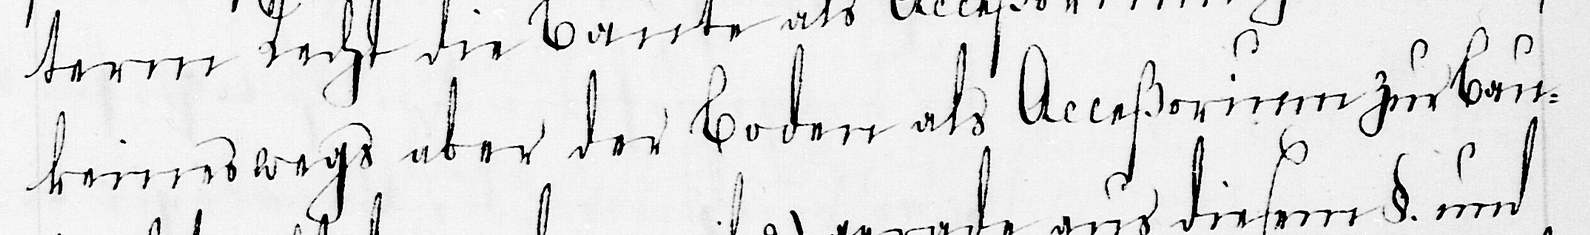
keineswegs aber der Boden als Acceßorium zur Bau¬
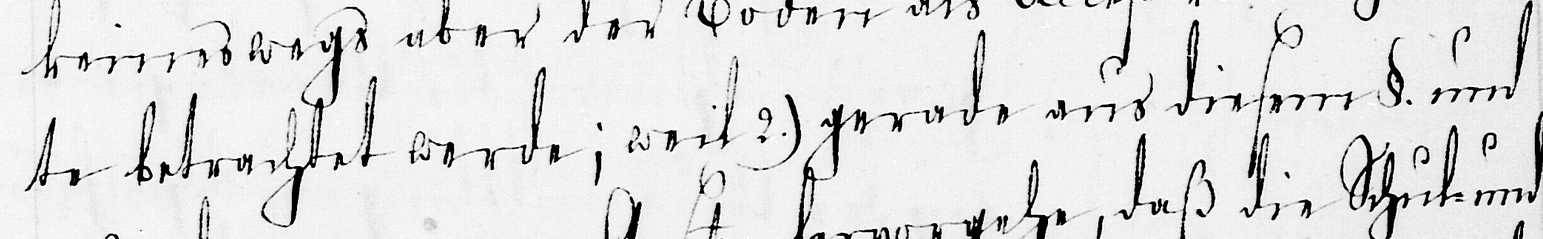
te betrachtet werde; weil 2.) gerade aus diesem §. und
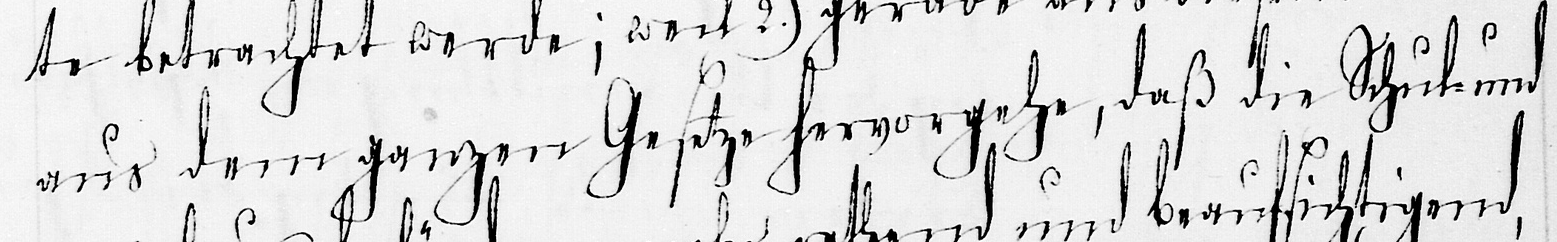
aus dem ganzen Gesetze hervorgehe, daß die Schul- und
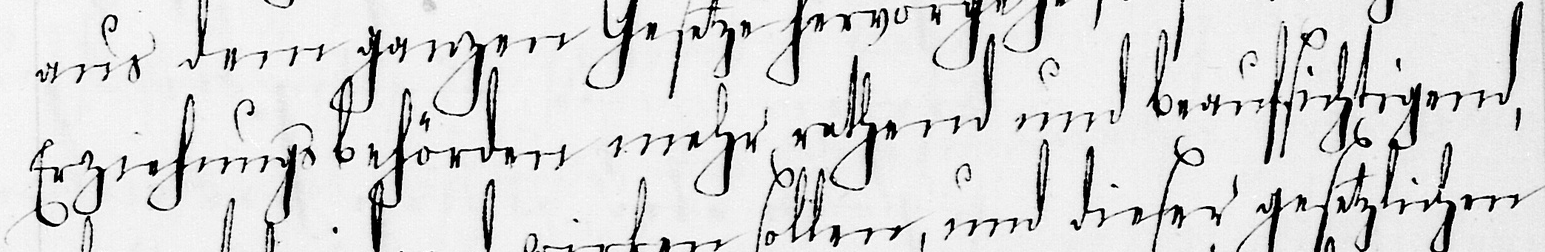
Erziehungsbehörden mehr rathend und beaufsichtigend,
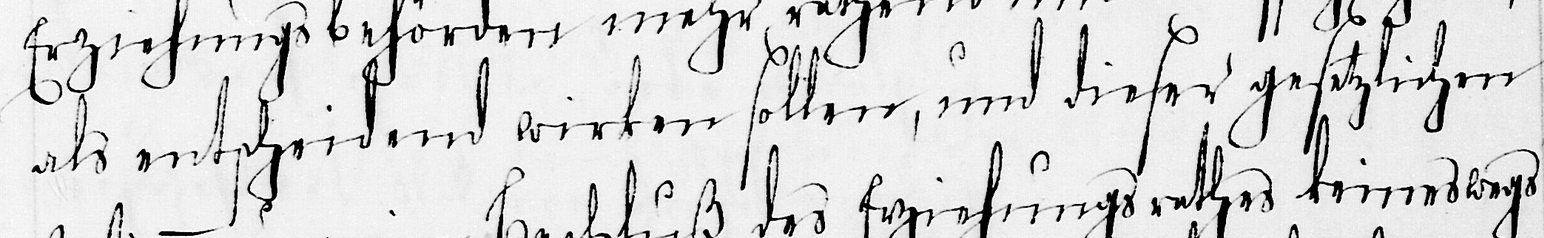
als entscheidend wirken sollen, und dieser gesetzlichen
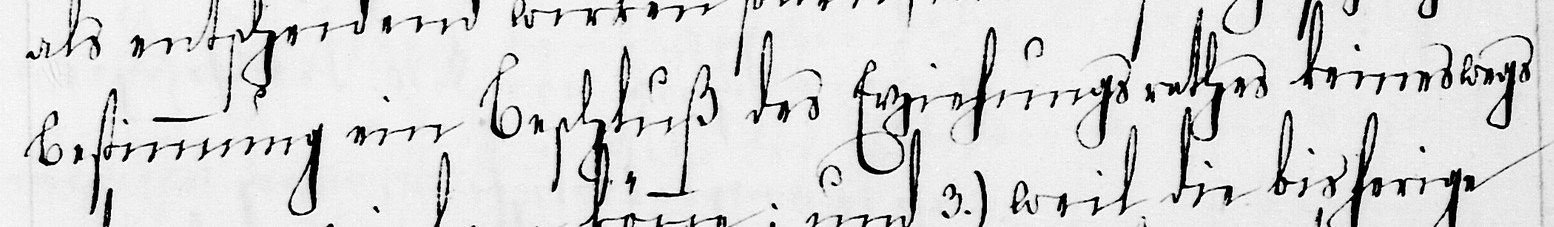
Bestimmung ein Beschluß des Erziehungsrathes keineswegs
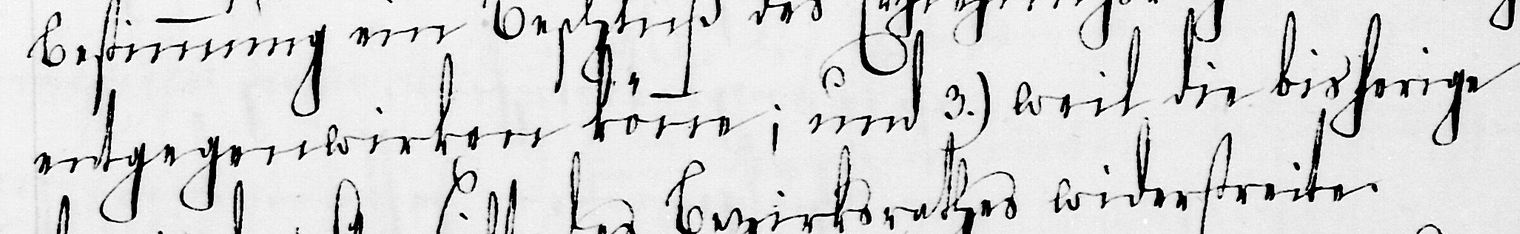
entgegenwirken könne; und 3.) weil die bisherige
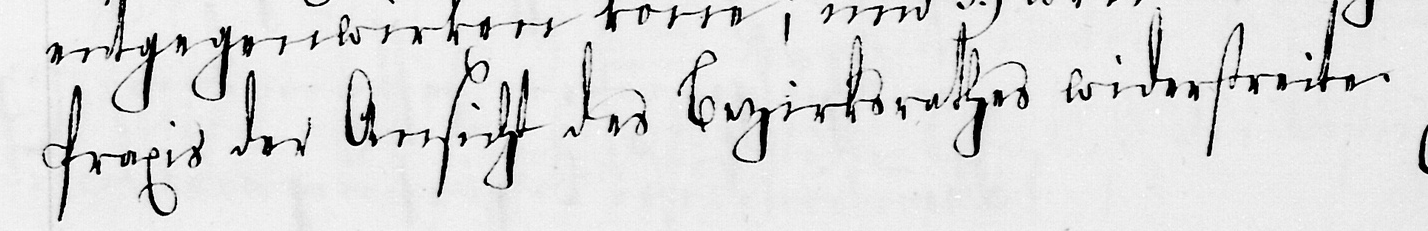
Praxis der Ansicht des Bezirksrathes widerstreite.
